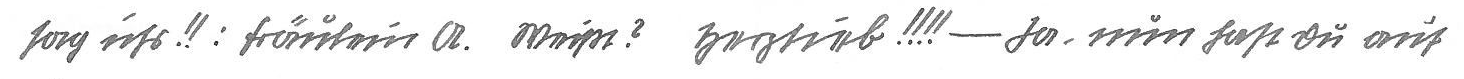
sag ichs!!: Fräulein A. Weißt? Herzlieb!!!! – Ja, nun hast Du auf
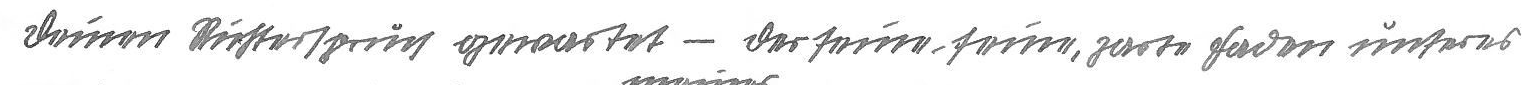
Deinen Richterspruch gewartet – der feine, feine, zarte Faden unseres
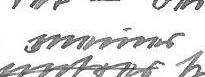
meiner
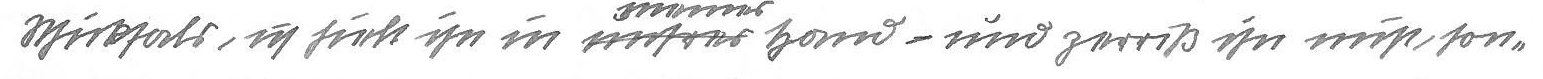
Schicksals, ich hielt ihn in unsrer Hand – und zerriß ihn nicht, son¬
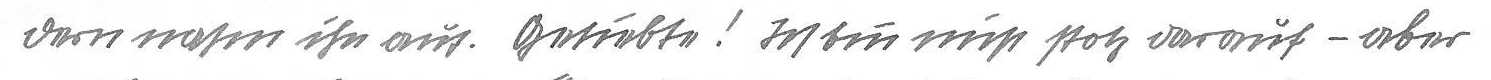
dern nahm ihn auf. Geliebte! Ich bin nicht stolz darauf – aber
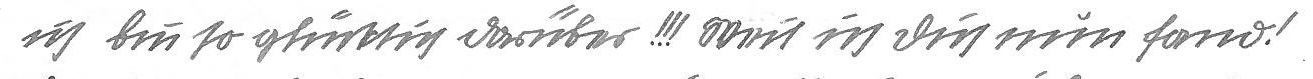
ich bin so glücklich darüber!!! Weil ich Dich nun fand!
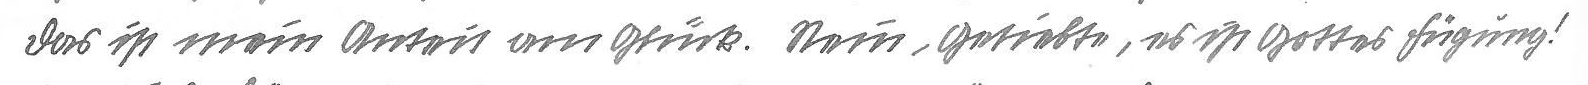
Das ist mein Anteil am Glück. Nein, Geliebte, es ist Gottes Fügung!
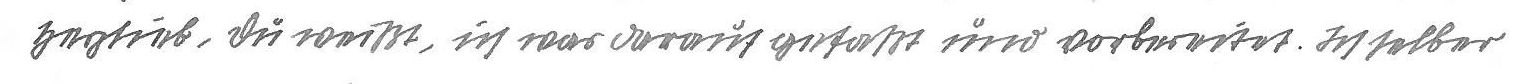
Herzlieb, Du weißt, ich war darauf gefaßt und vorbereitet. Ich selber
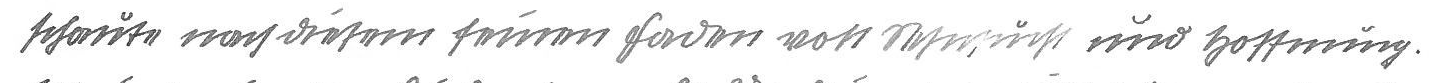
schaute nach diesem feinen Faden voll Sehnsucht und Hoffnung.
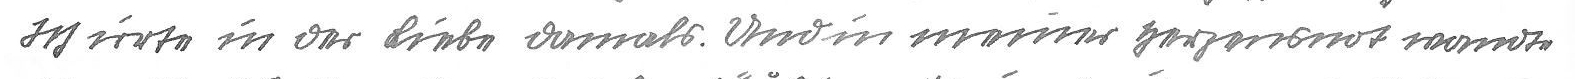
Ich irrte in der Liebe damals. Und in meiner Herzensnot wandte
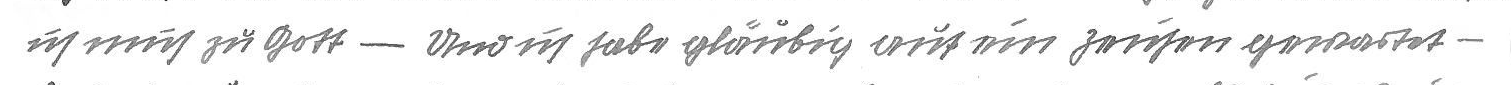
ich mich zu Gott – Und ich habe gläubig auf ein Zeichen gewartet –
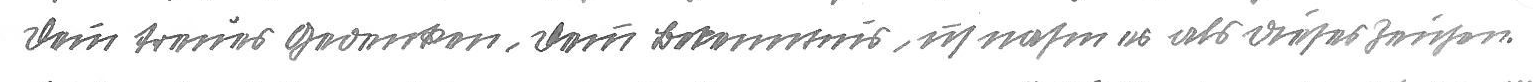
Dein treues Gedenken, Dein Bekenntnis, ich nahm es als dieses Zeichen.
